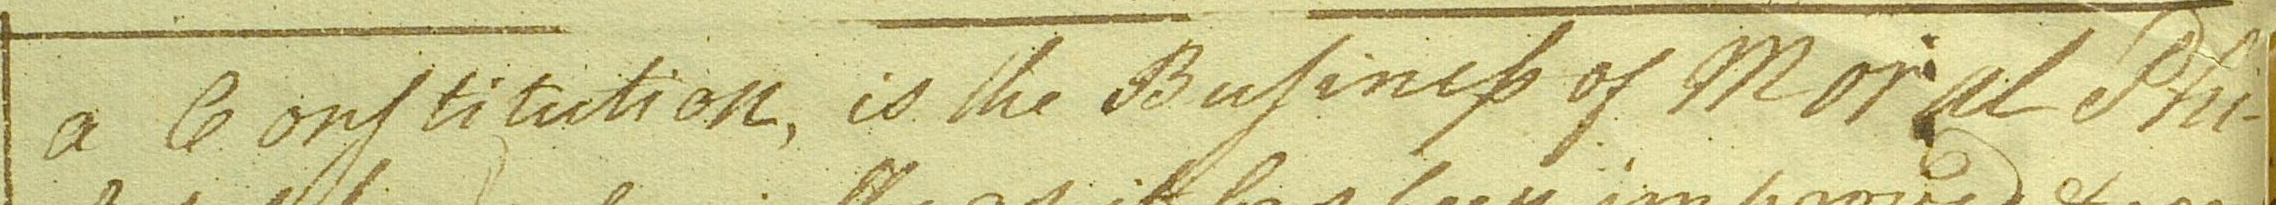a Constitution, is the Business of Moral Phi-
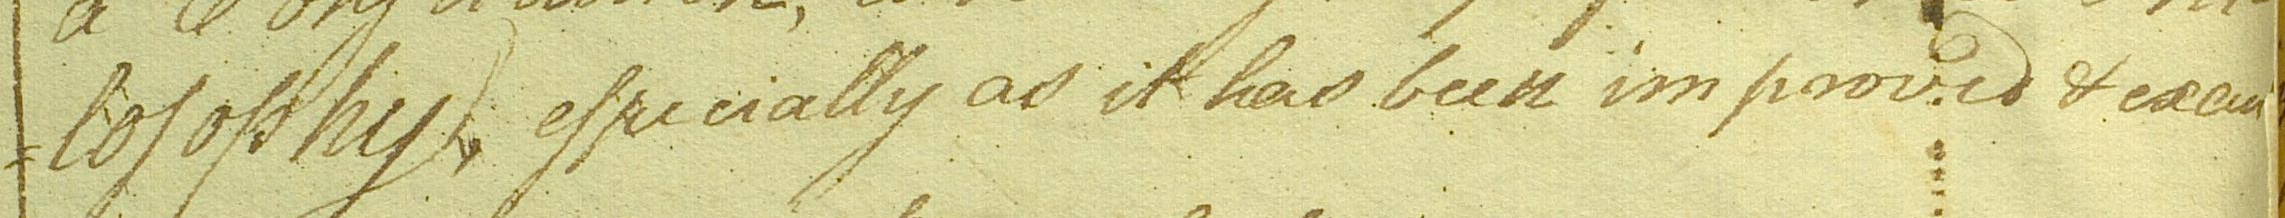-losophy, especially as it has been improved & execu-
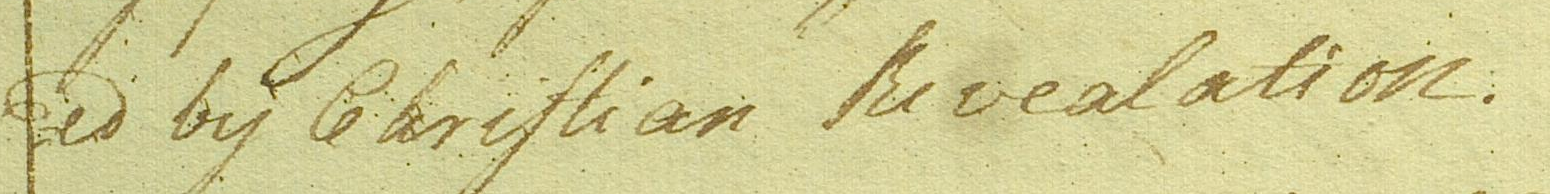ed by Christian Revealation.
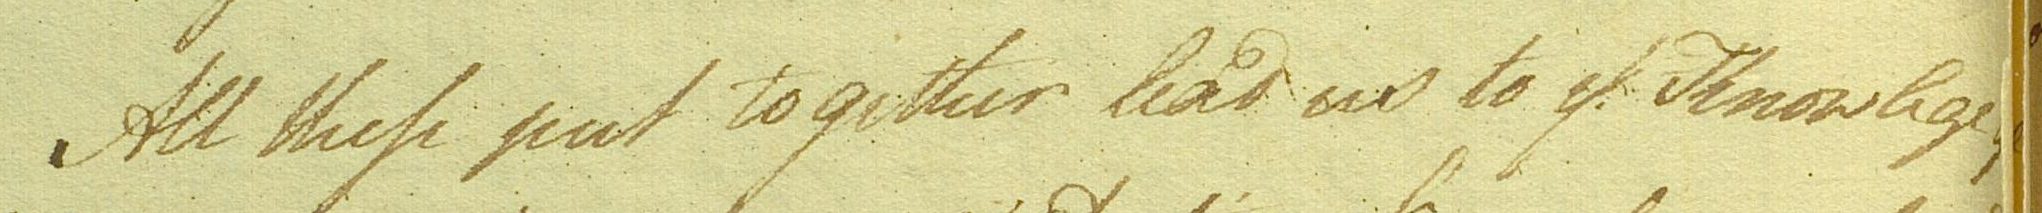All these put together lead us to y^e. Knowledge,
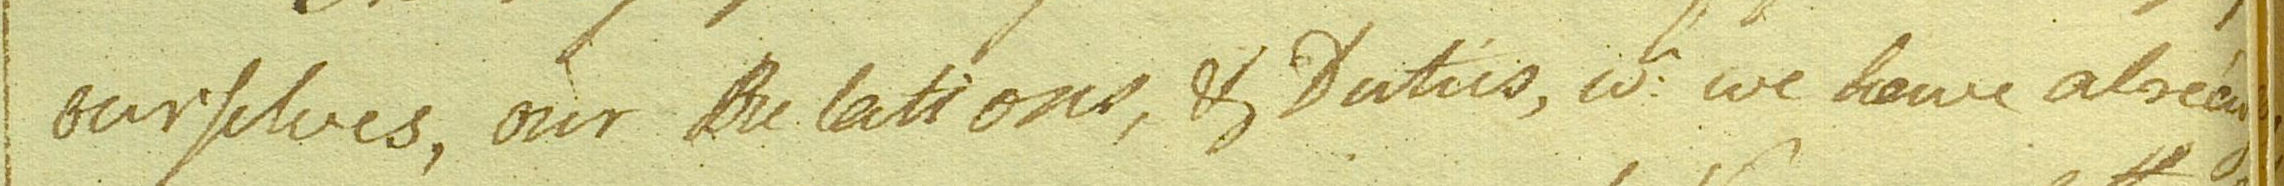ourselves, our Relations, & Duties, w^h. we have already
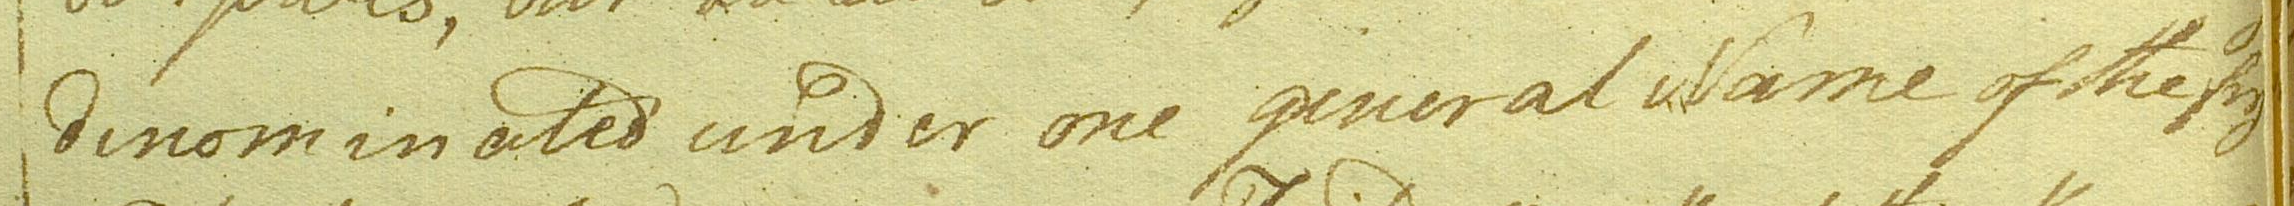denominated under one general Name of the [__]
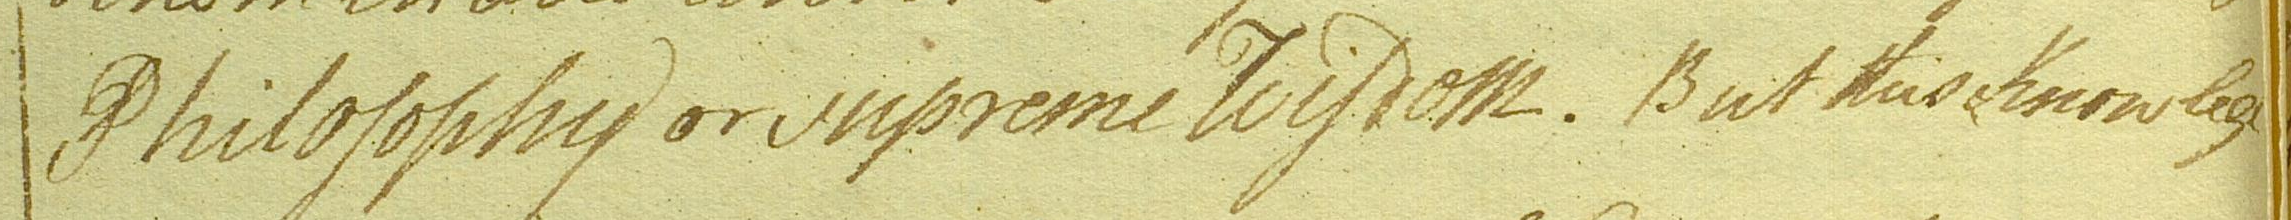Philosophy or supreme Wisdom. But this knowledge
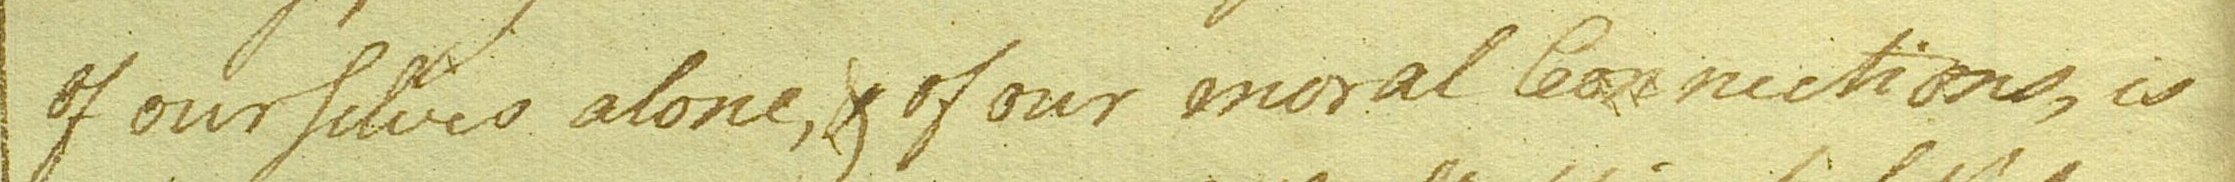of ourselves alone, & of our moral Connections, is
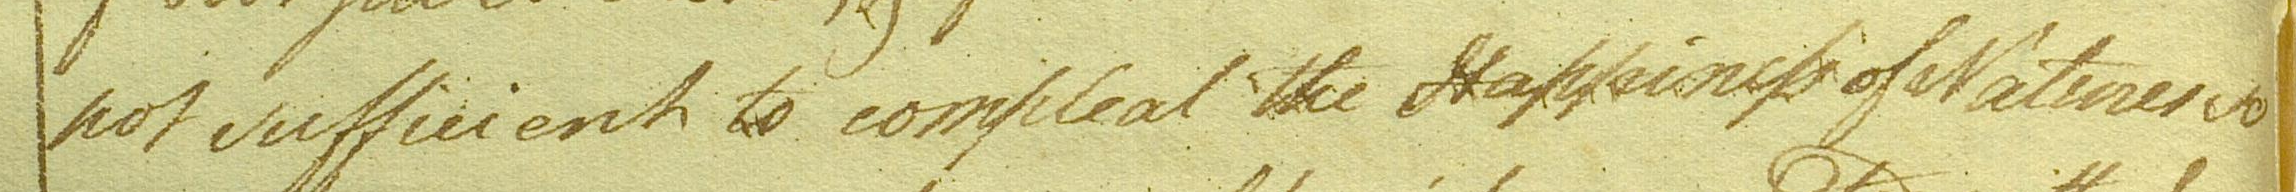not sufficient to compleat the Happiness of Natures as
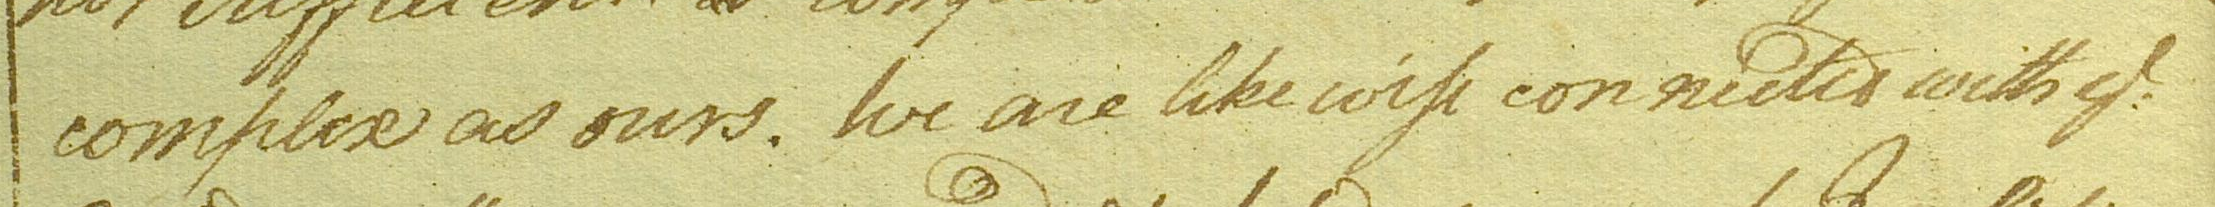complex as ours. We are like wise connected with y^e.
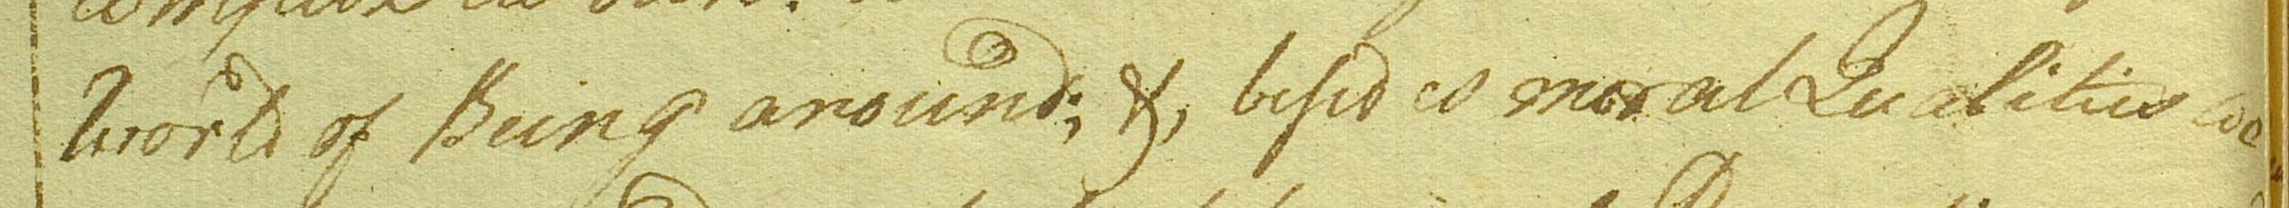Word of Being around; & besides moral Qualities we
